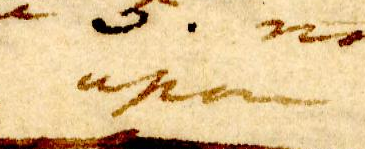upon
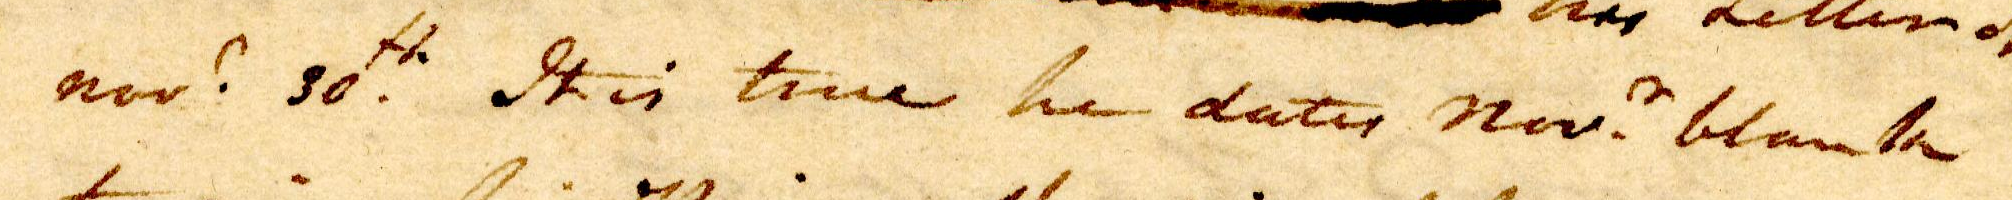nov^r. 30^th. It is true he dates Nov^r. blank
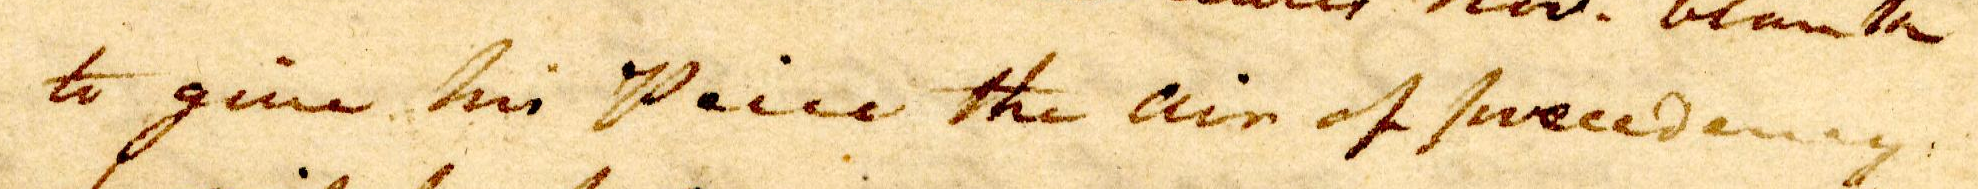to give his piece the Air of precedency
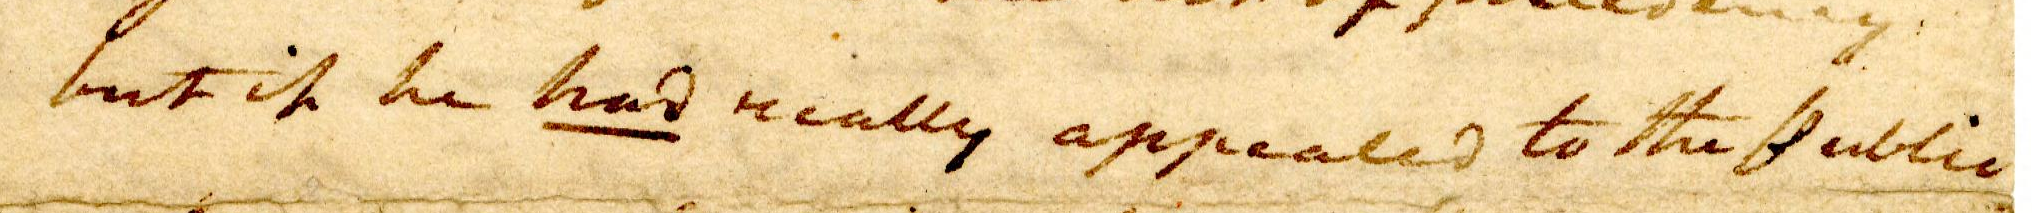but if he had really appealed to the Public
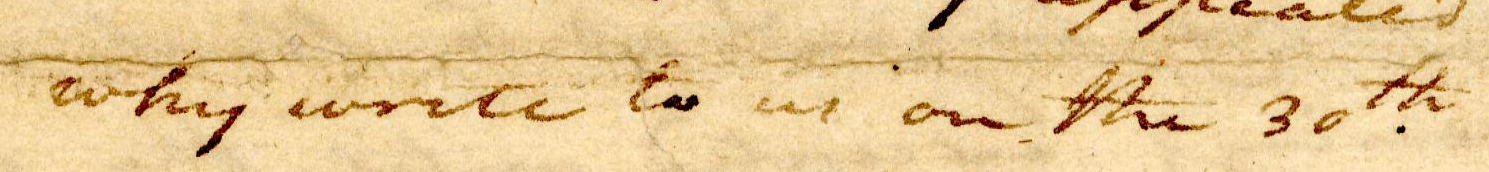why write to us on the 30^th
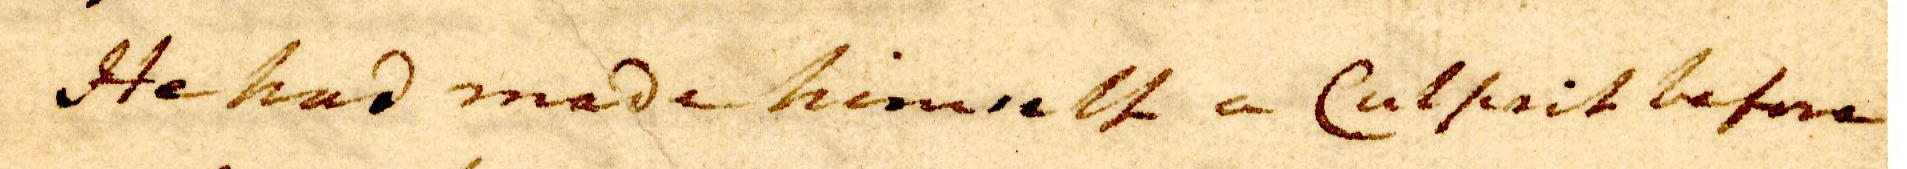He had made himself a Culprit before
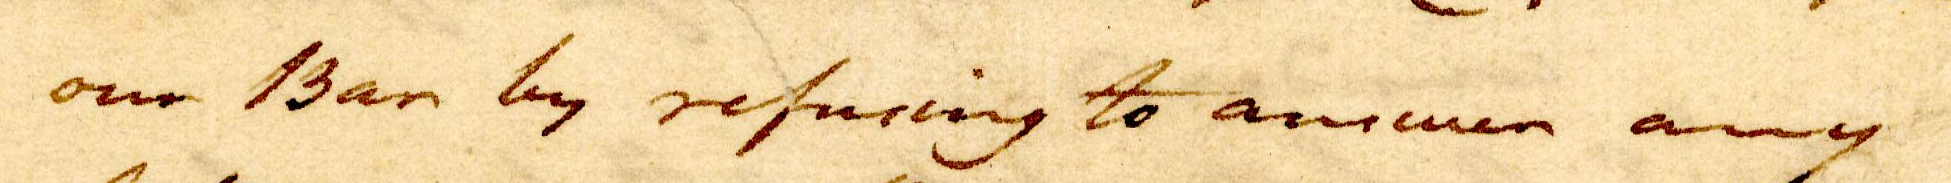our Bar by refusing to answer any
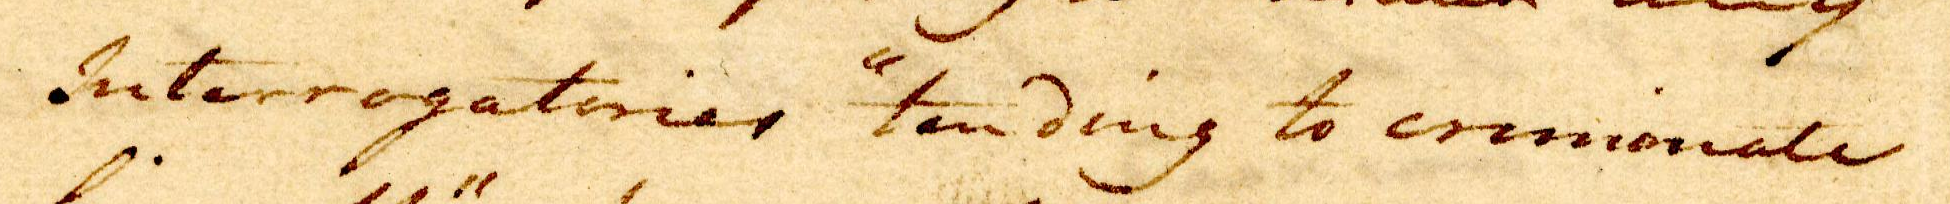Interrogatories "tending to criminate
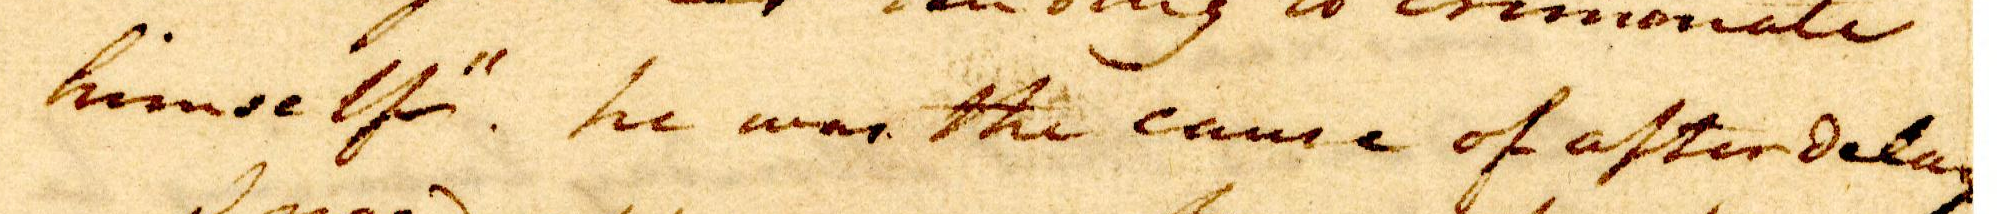himself" he was the cause of after delay
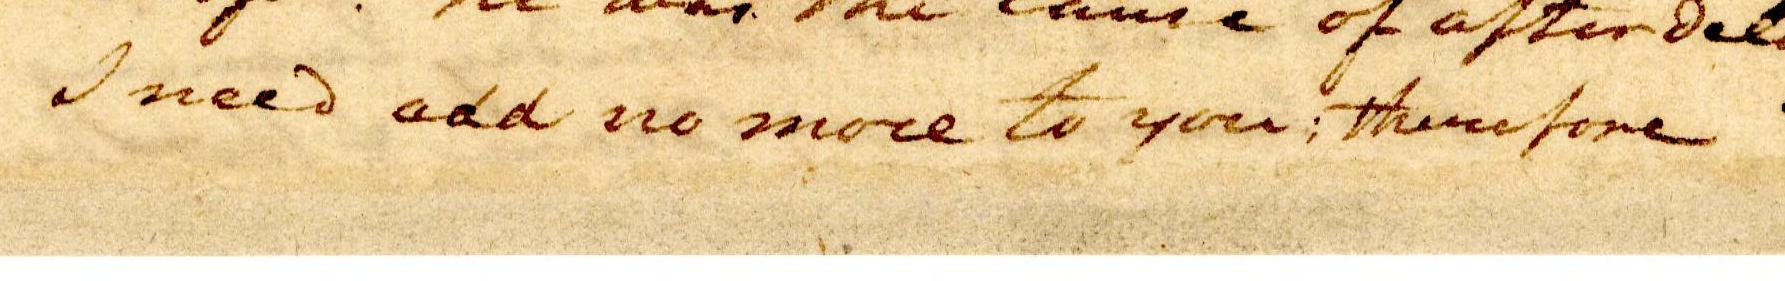I need add no more to you; therefore
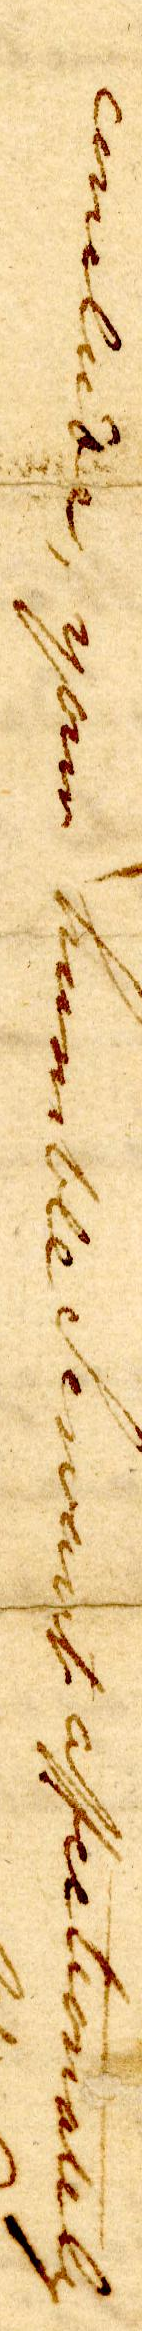conclude, your humble servant affectionately
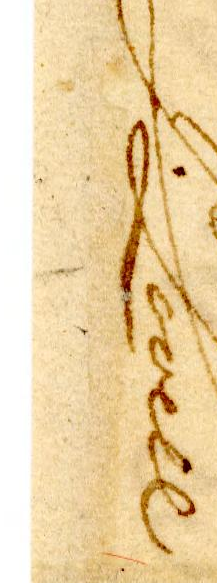J^s Lovell
